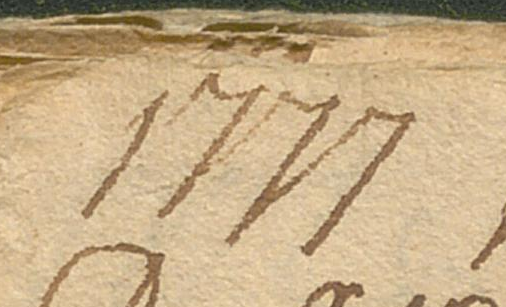1777
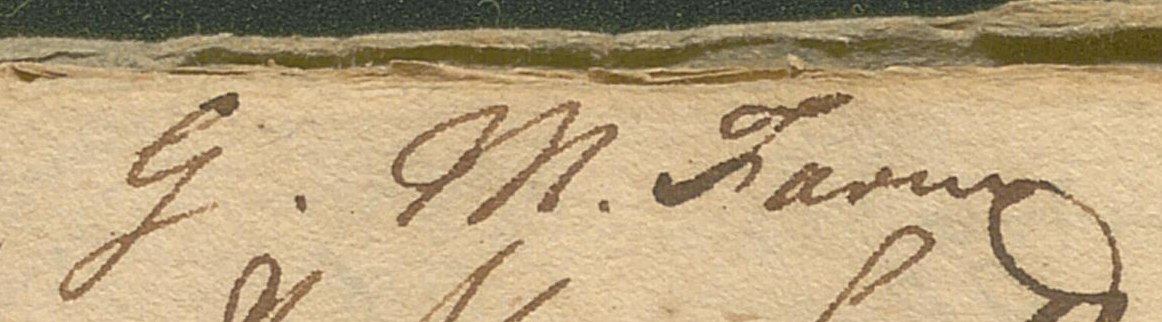G. M. Farm
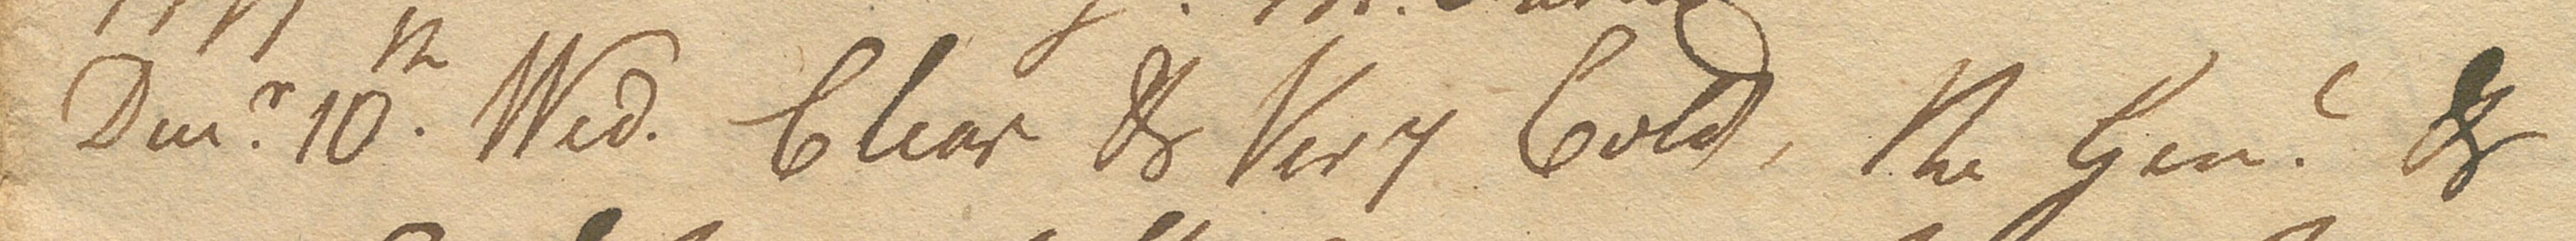Dec^r. 10^th. Wed. Clear & Very Cold. the Gen^l. &
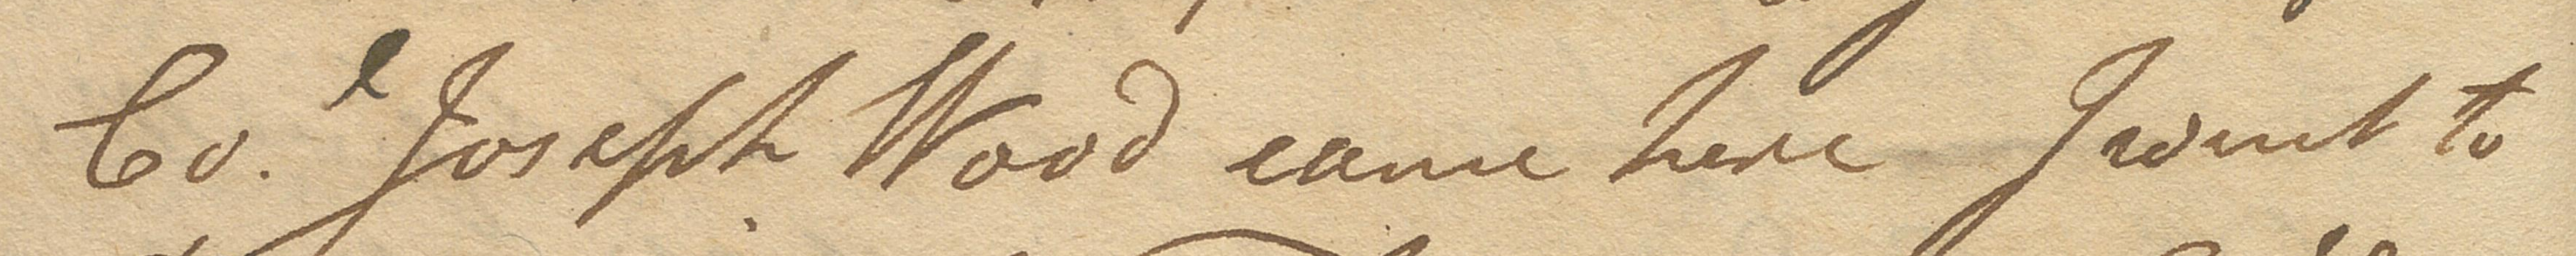Co. Joseph Wood came here I went to
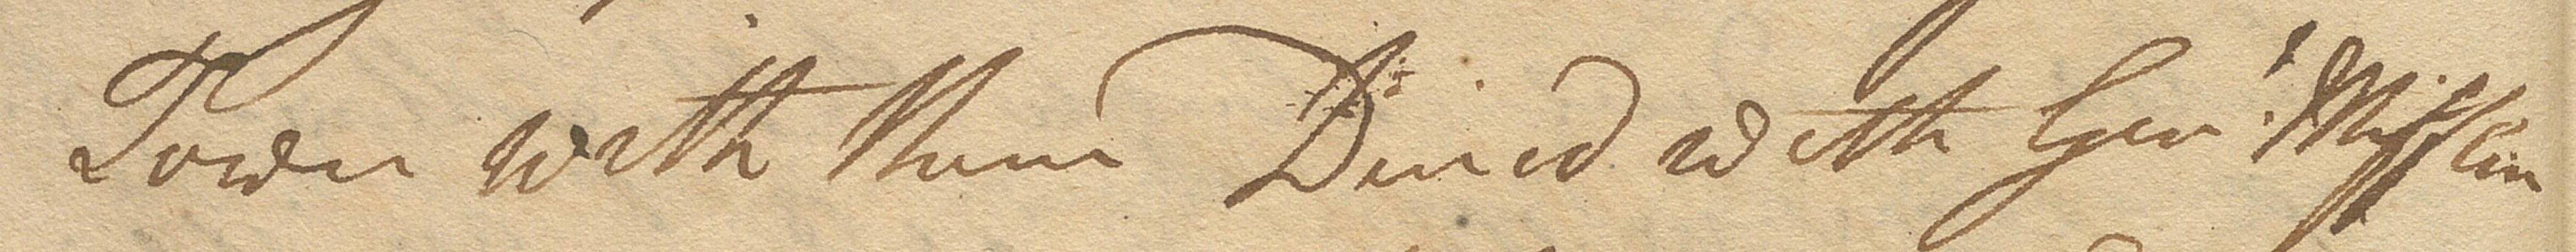Town with them Dined with Gen^l Mifflin
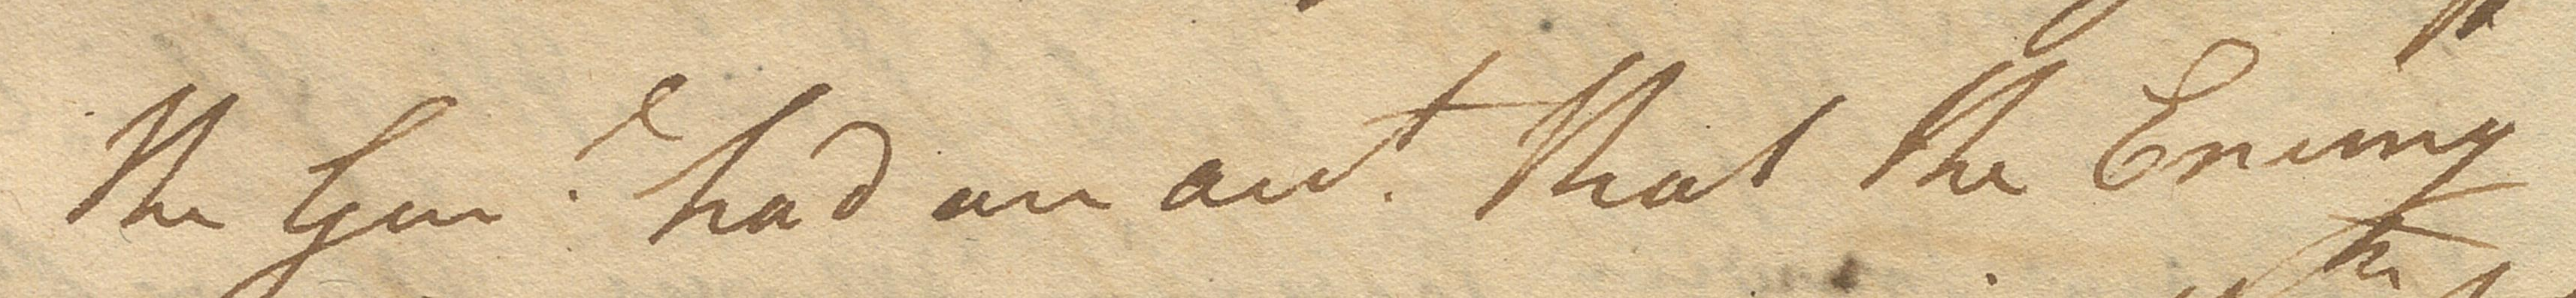the Gen^l. had an acc^t. that the Enemy
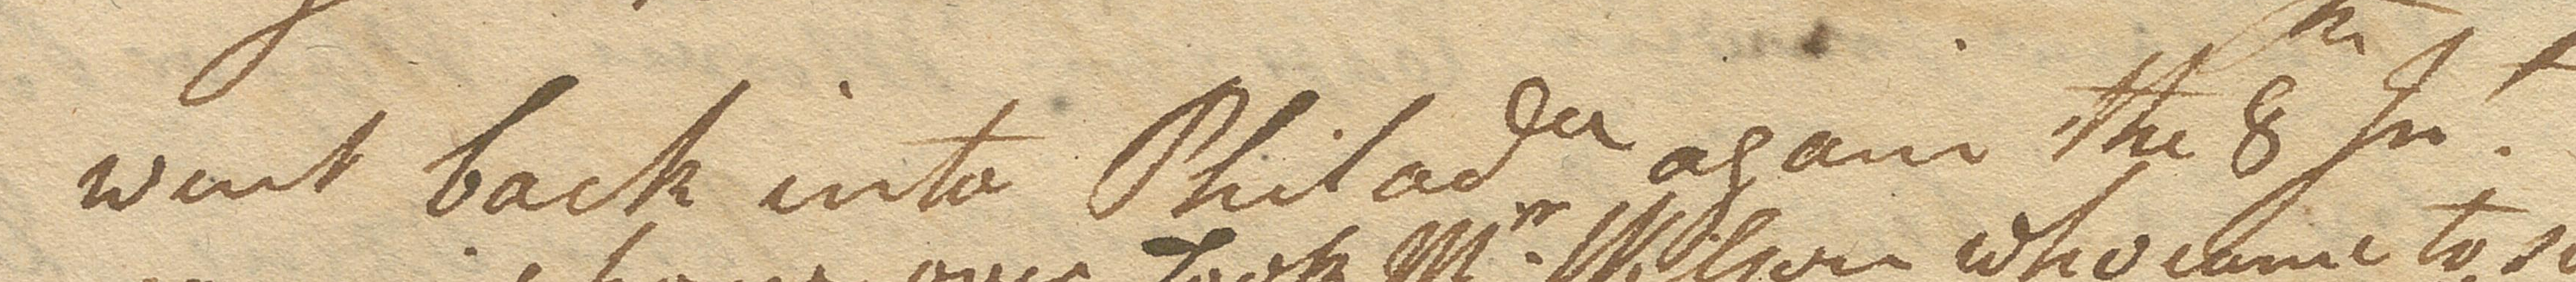went back into Philad^a. again the 8th In^t.
